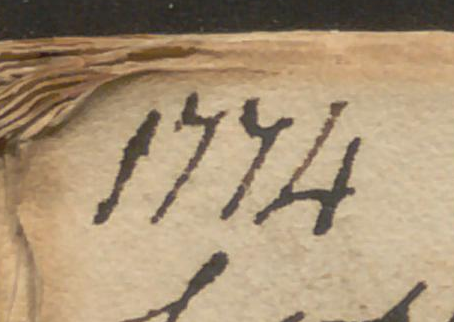1774
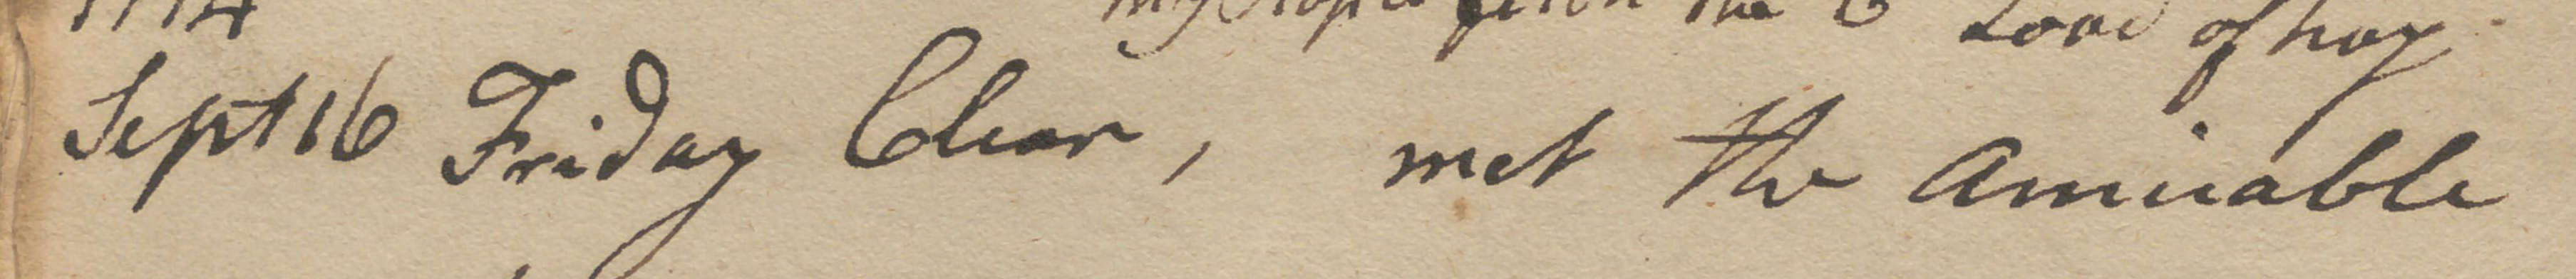Sept 16 Friday Clear, met the Amicable
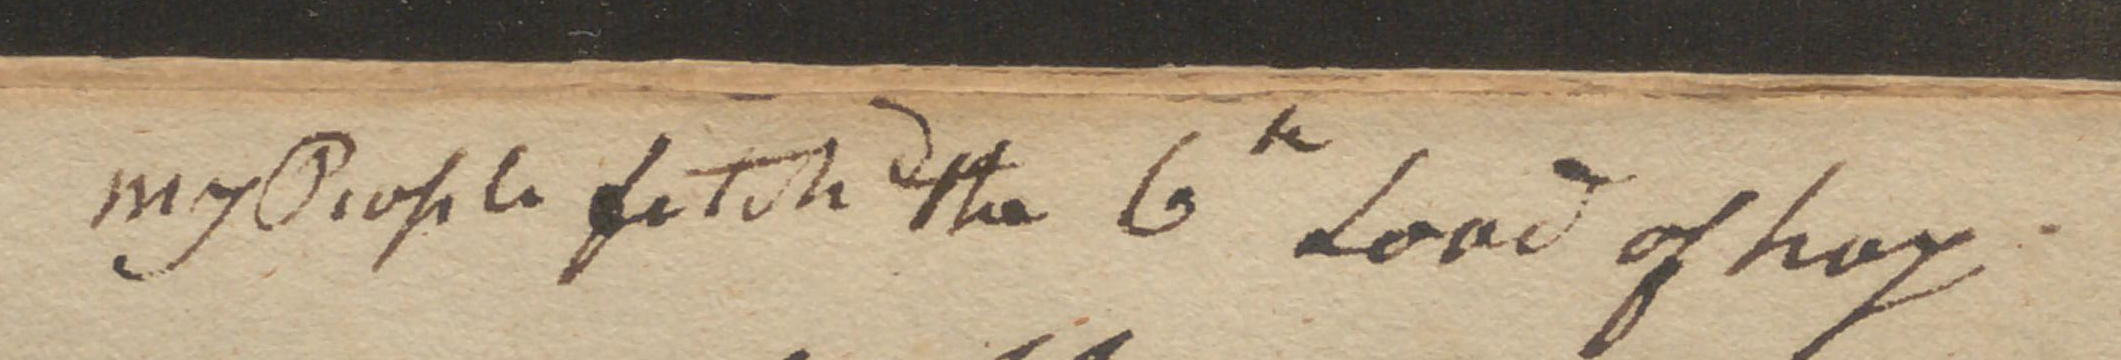my People fetch^d the 6^th Load of hay
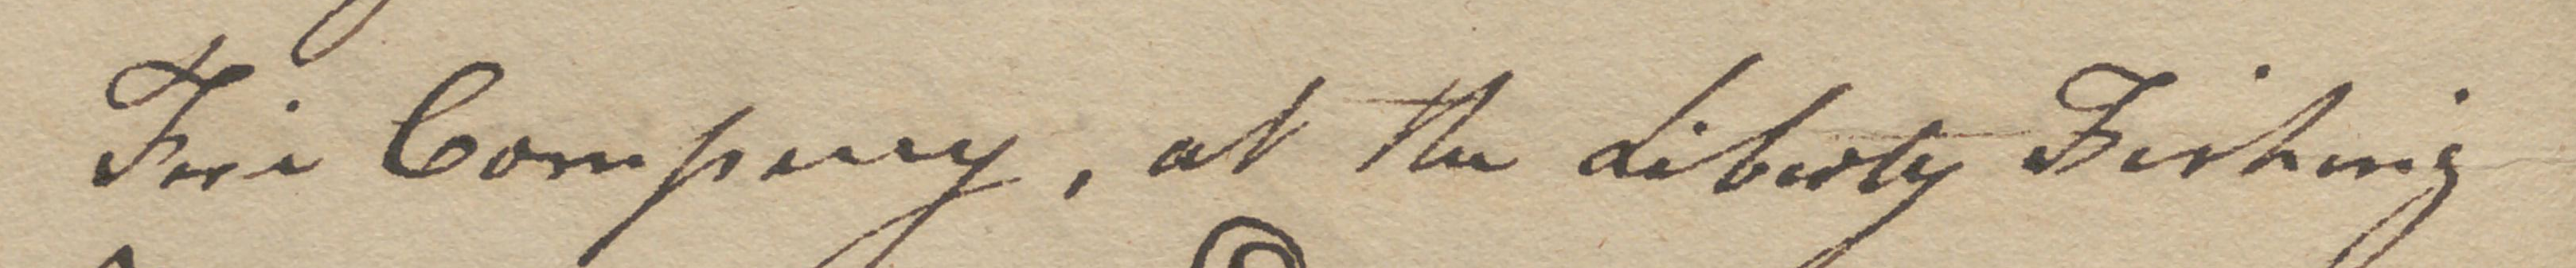Fire Company, at the Liberty Fishing
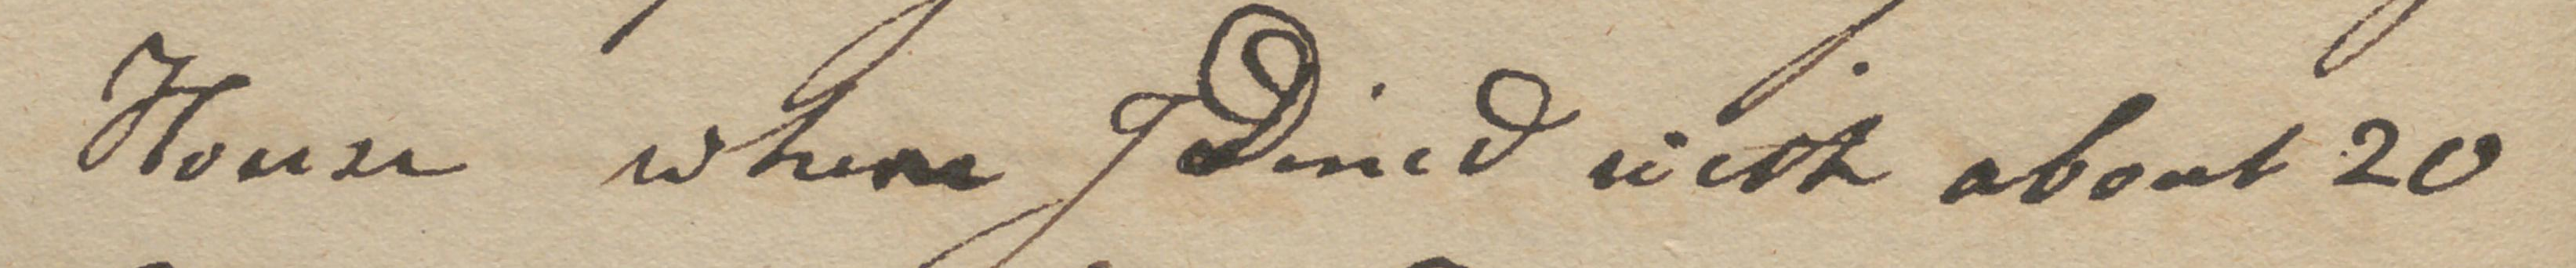House where I Dined with about 20
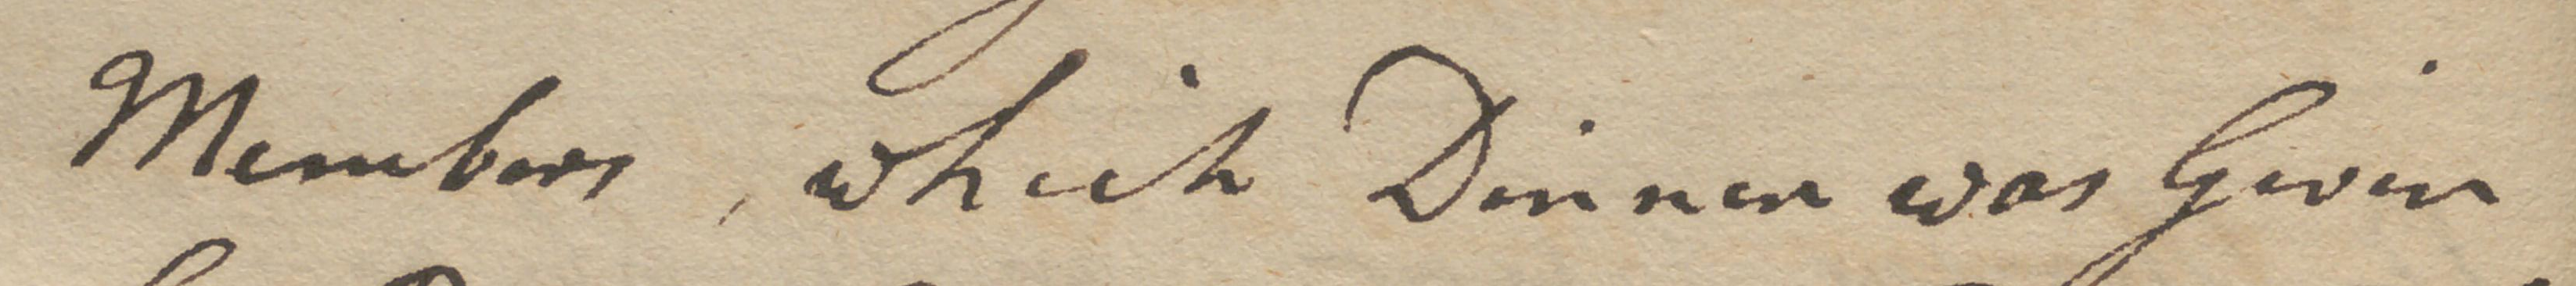Members which Dinner was Given
